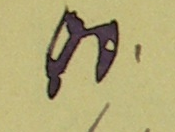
80
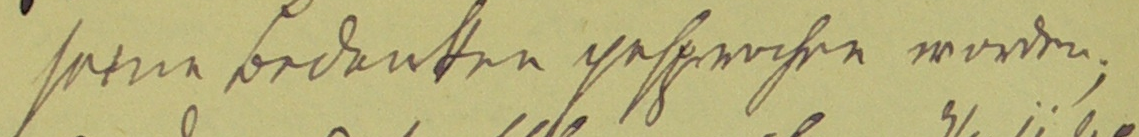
seine Bedenken gesprochen worden
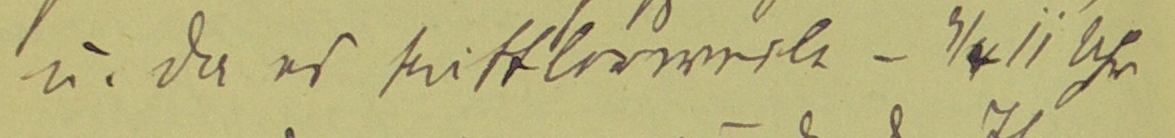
und da es mittlerweile -3/4 11 Uhr
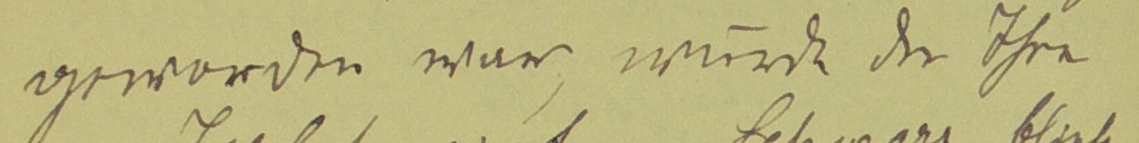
geworden war , wurde der Thee
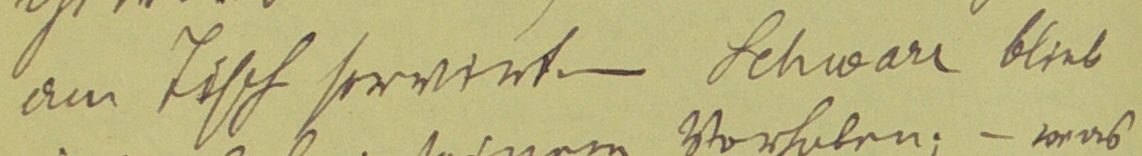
am Tisch serviert.-Schwarz blieb
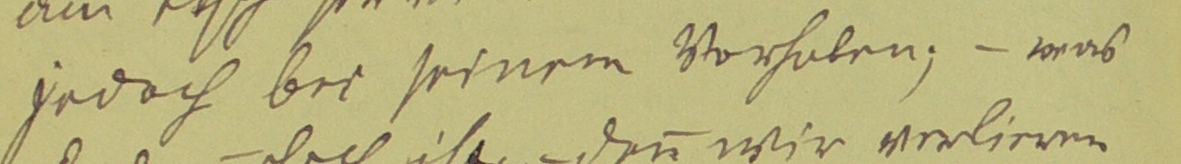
jedoch bei seinem Vorhaben.;-was
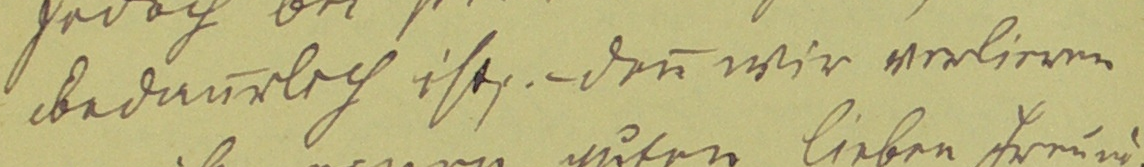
bedauerlich ist.- denn wir verlieren
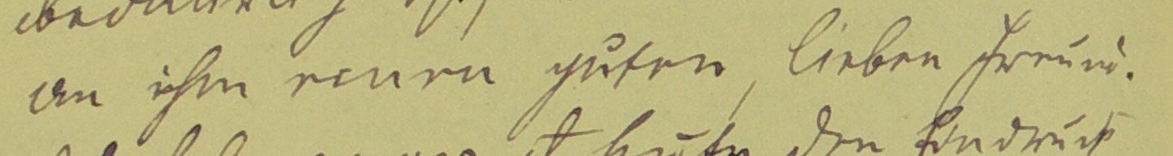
an ihm einen guten lieben Freund,
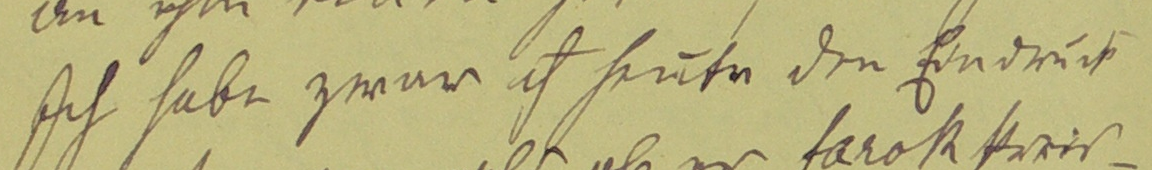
Ich habe zwar auch heute den Eindruck
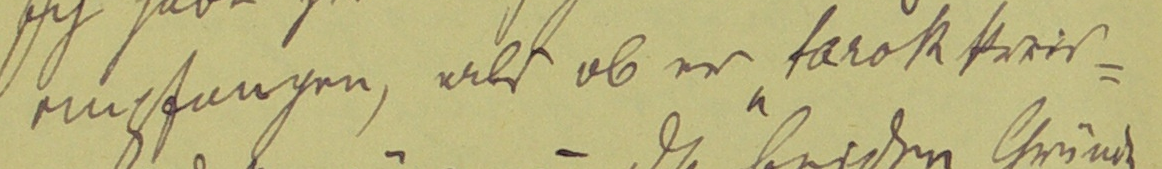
empfangen, als ob er Tarockkreis¬
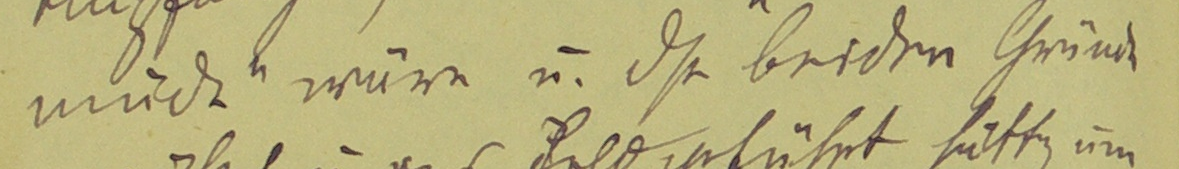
müde wäre und die beiden Gründe
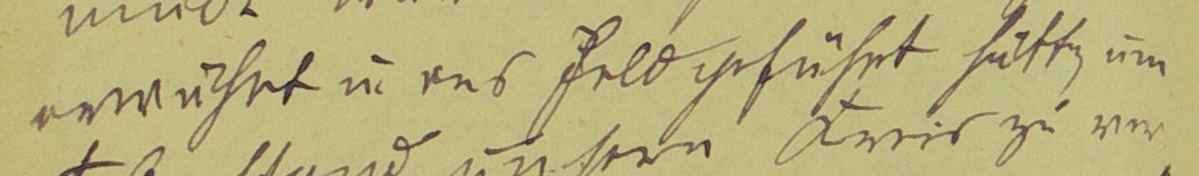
erwähnt und ins Feld geführt hätte, um
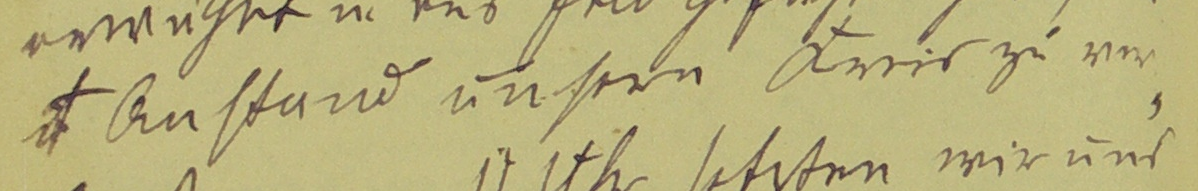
mit Anstand unseren Kreis zu ver¬
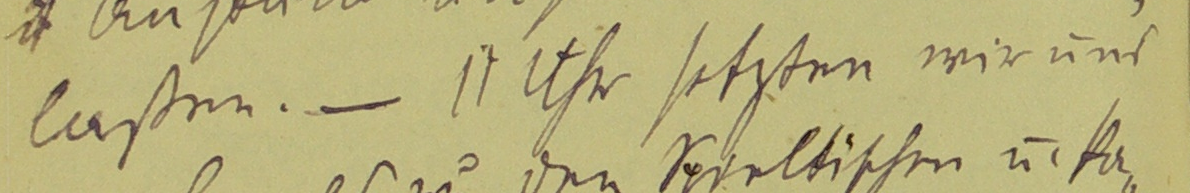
lassen.-11 Uhr setzten wir uns
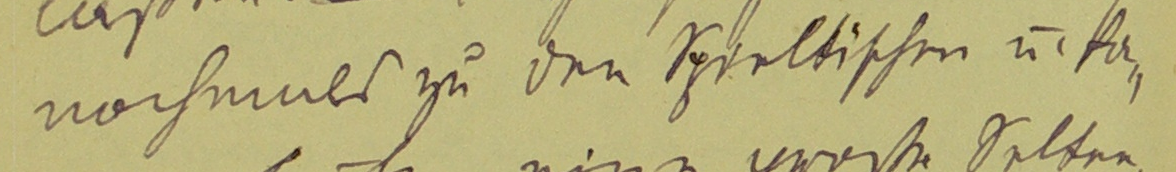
nochmals zu den Spieltischen und ka¬
